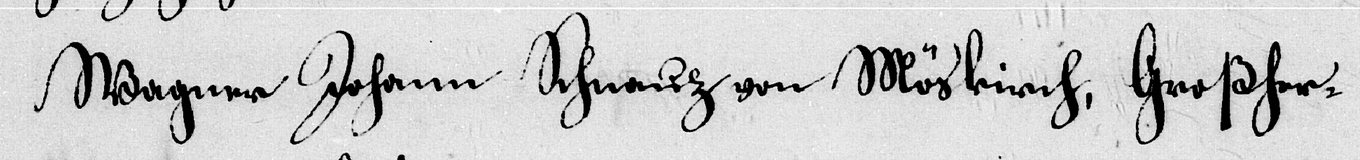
Wagner Johann Schnauz von Möskirch, Großher¬
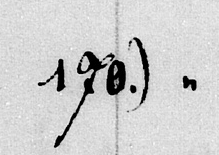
173.) “
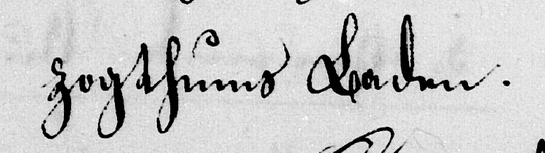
zogthums Baden.
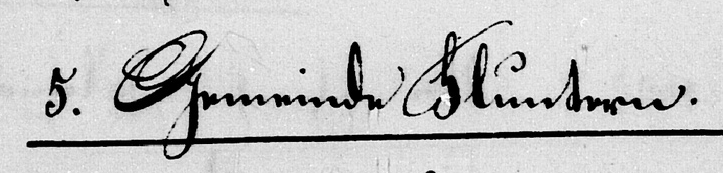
5. Gemeinde Fluntern.
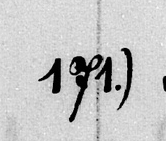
171.)
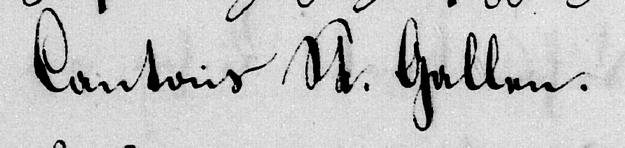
Cantons St. Gallen.
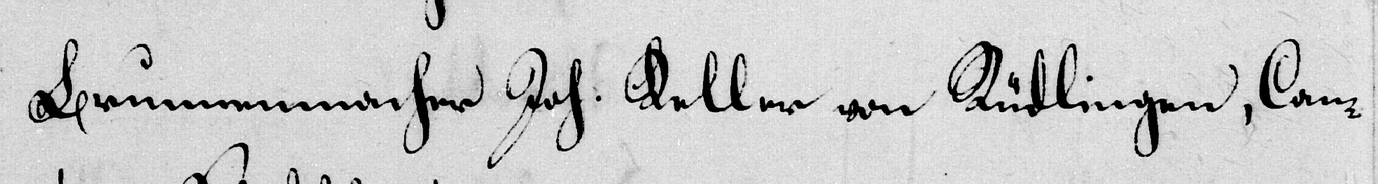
Brunnenmacher Joh. Keller von Rüdlingen, Can¬
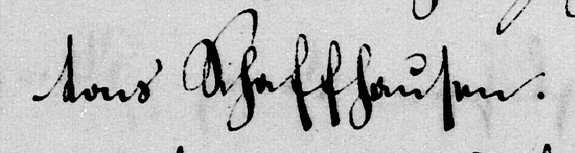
tons Schaffhausen.
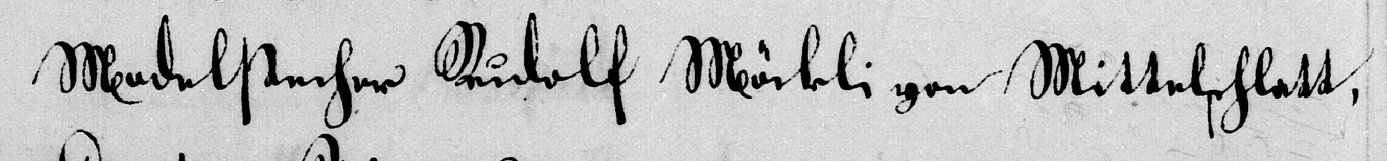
Modelstecher Rudolf Märkli von Mittelschlatt,
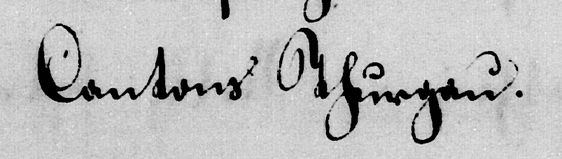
Cantons Thurgau.
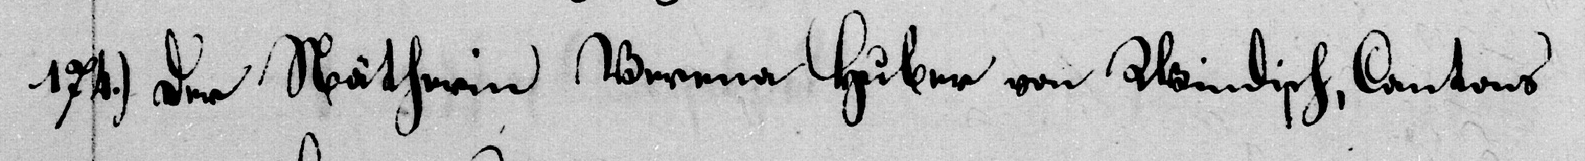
174.) Der Nätherin Verena Huber von Windisch, Cantons
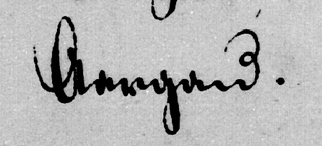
Aargau.
